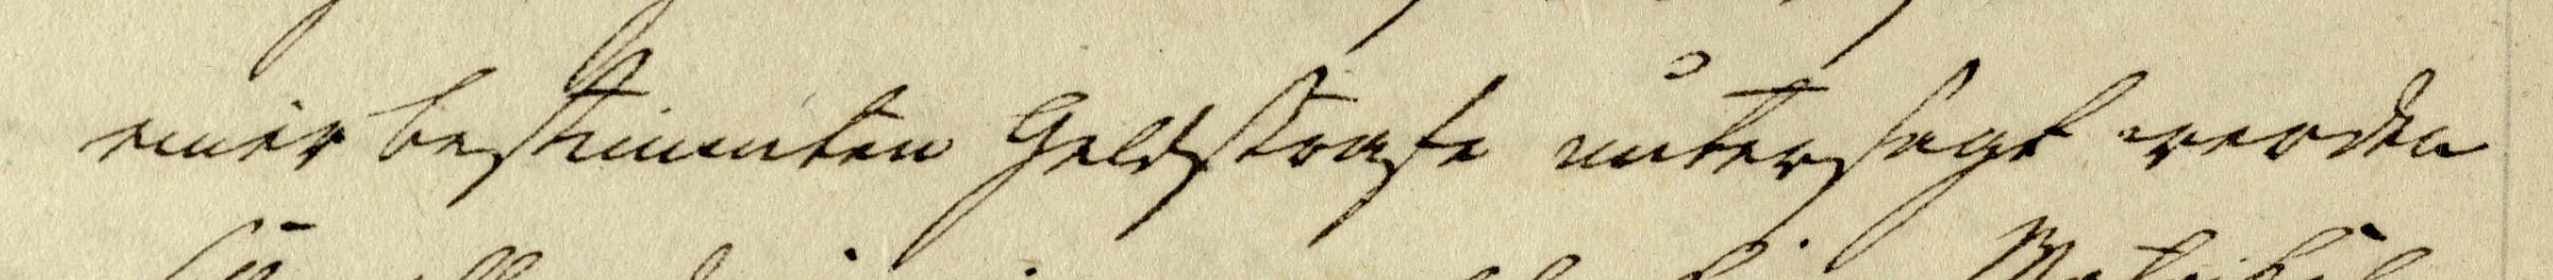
einer bestimmten Geldstrafe untersagt werden
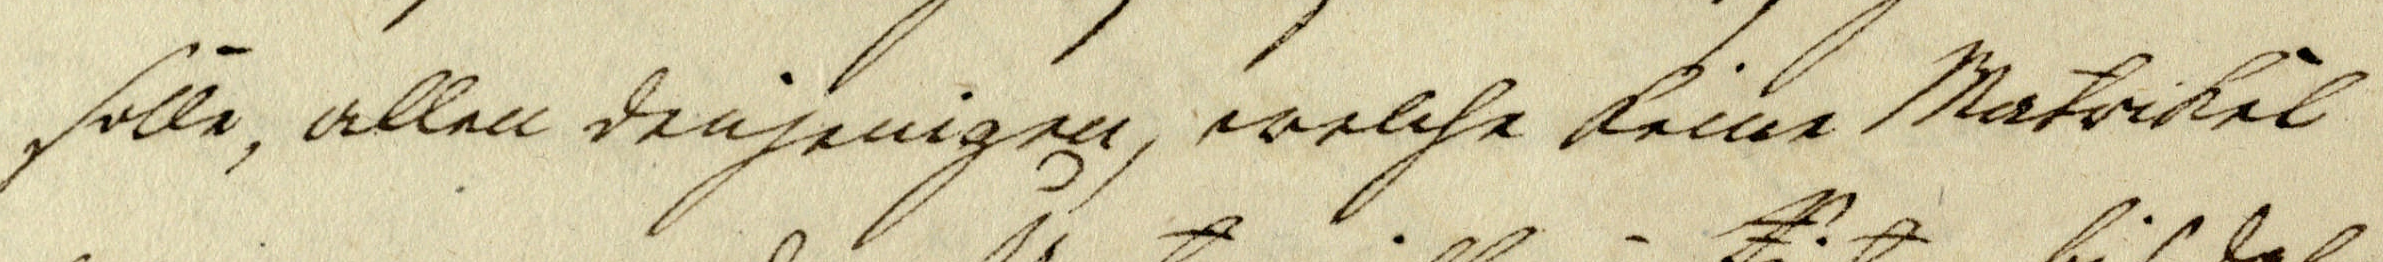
solle, allen denjenigen, welche keine Matrikel
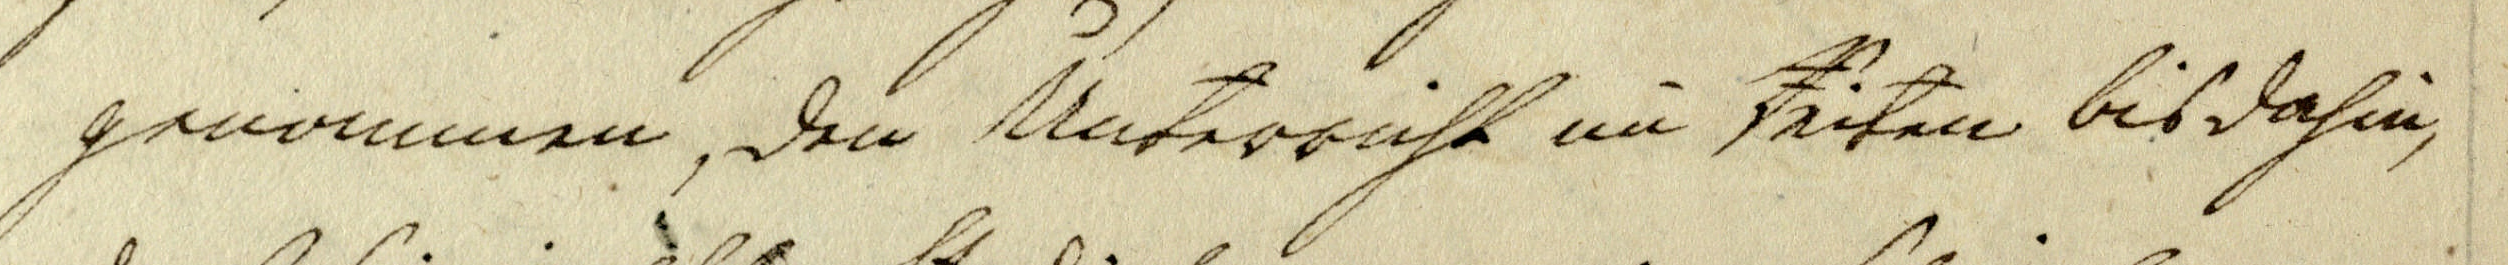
genommen, den Unterricht im Reiten bis dahin,
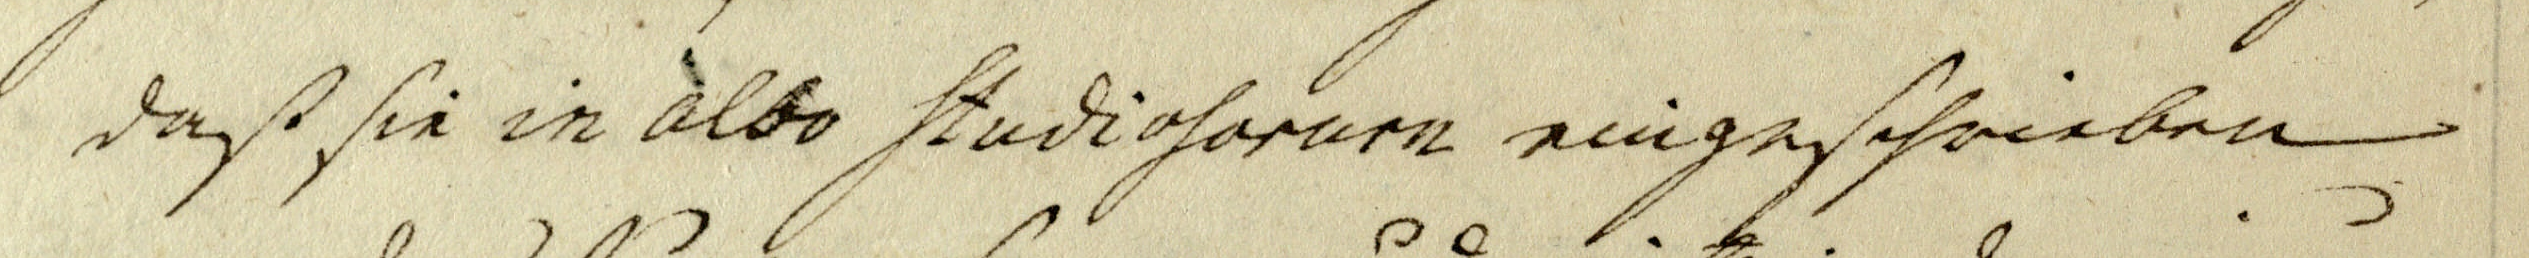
daß sie in albo Studiosorum eingeschrieben
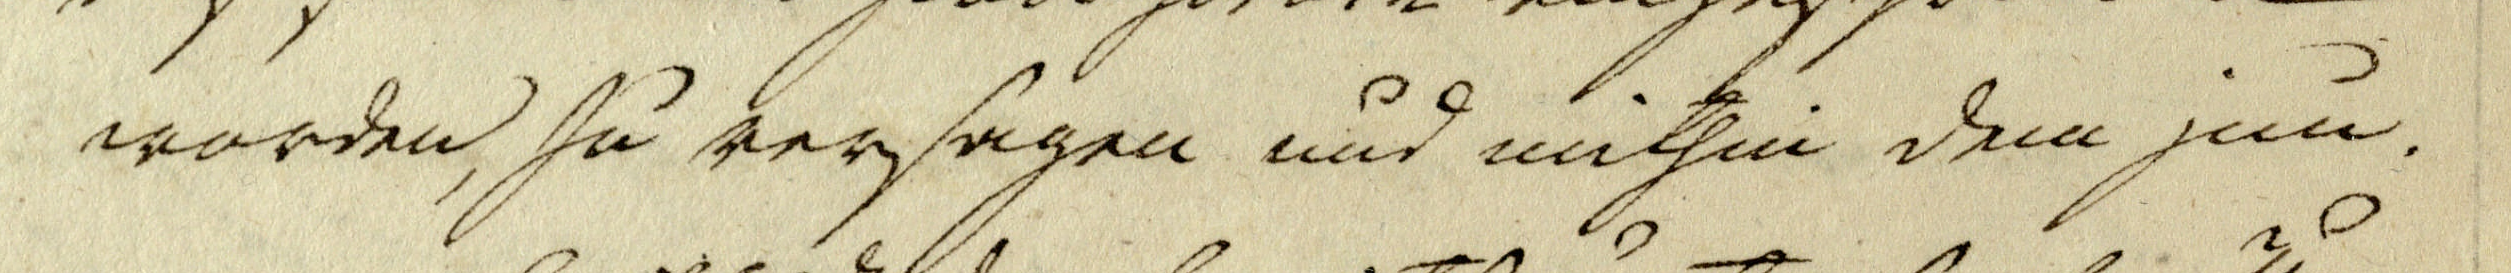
worden, zu versagen und mithin dem jun¬
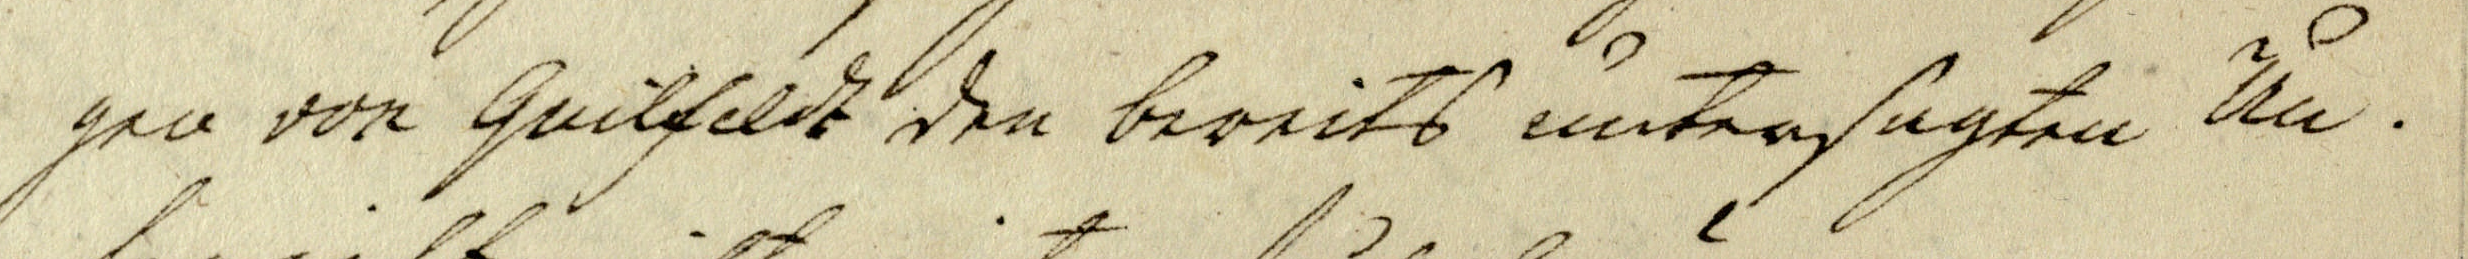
gen von Quilfeldt den bereits untersagten Un¬
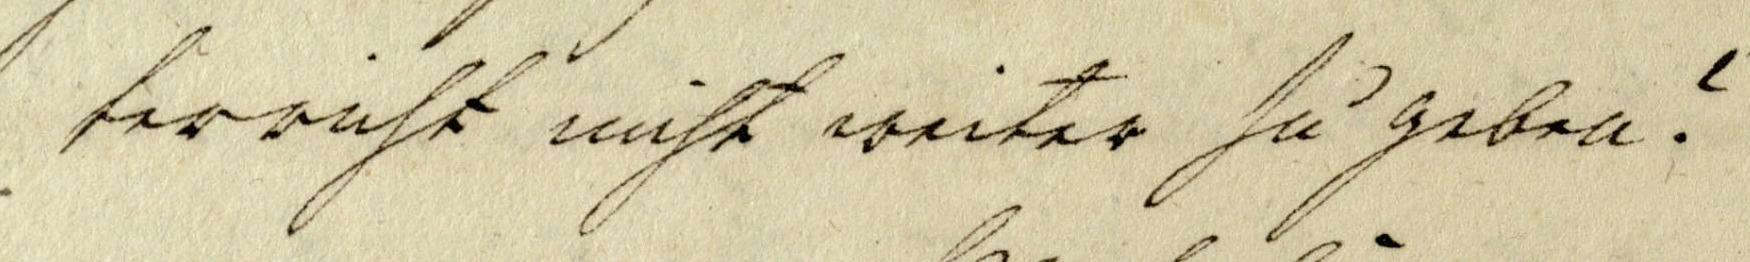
terricht nicht weiter zu geben?
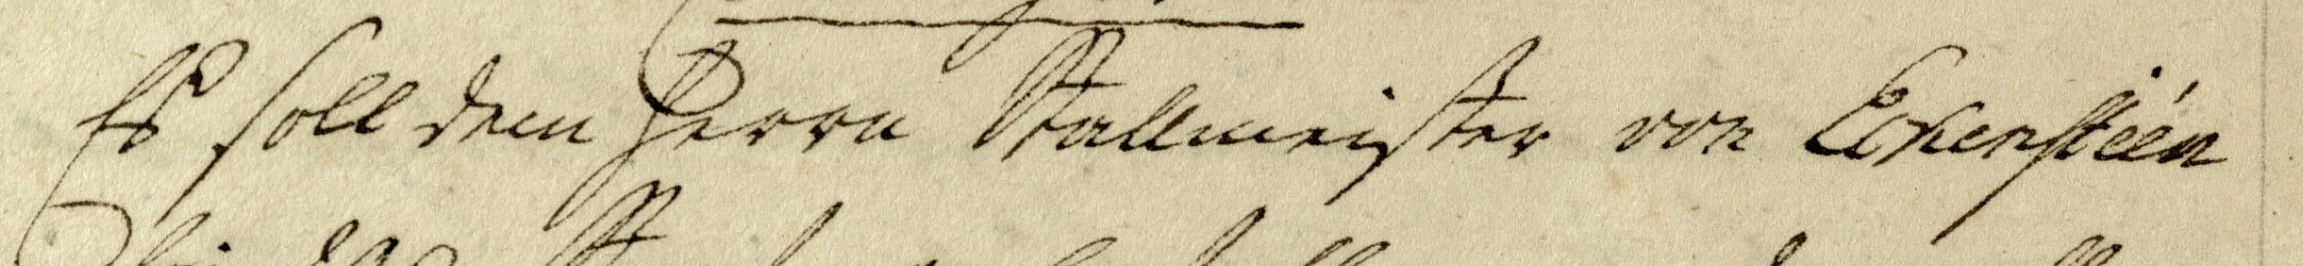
Es soll dem Herrn Stallmeister von Eckensteén
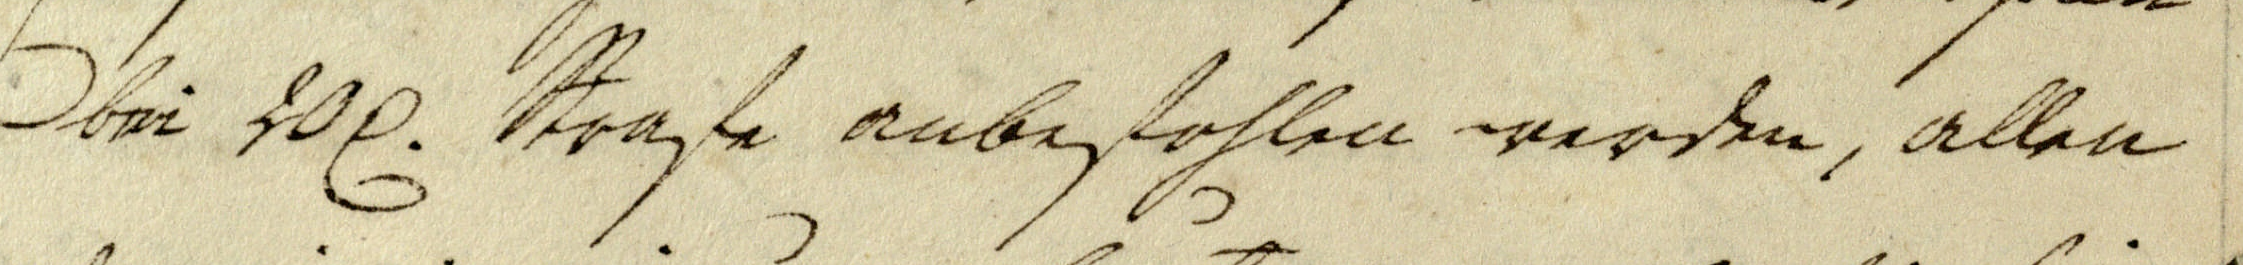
bei 2 l. Strafe anbefohlen werden, allen
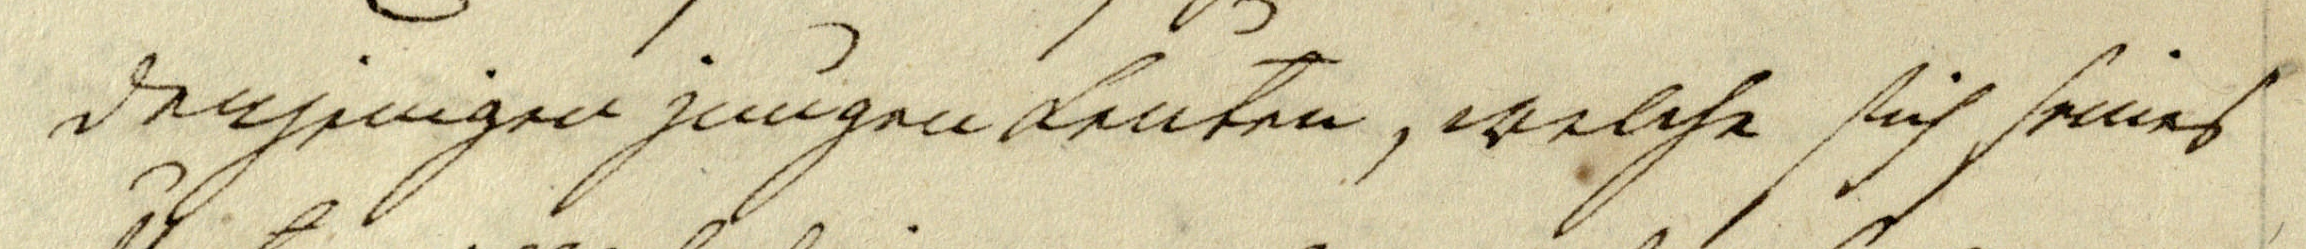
denjenigen jungen Leuten, welche sich seines
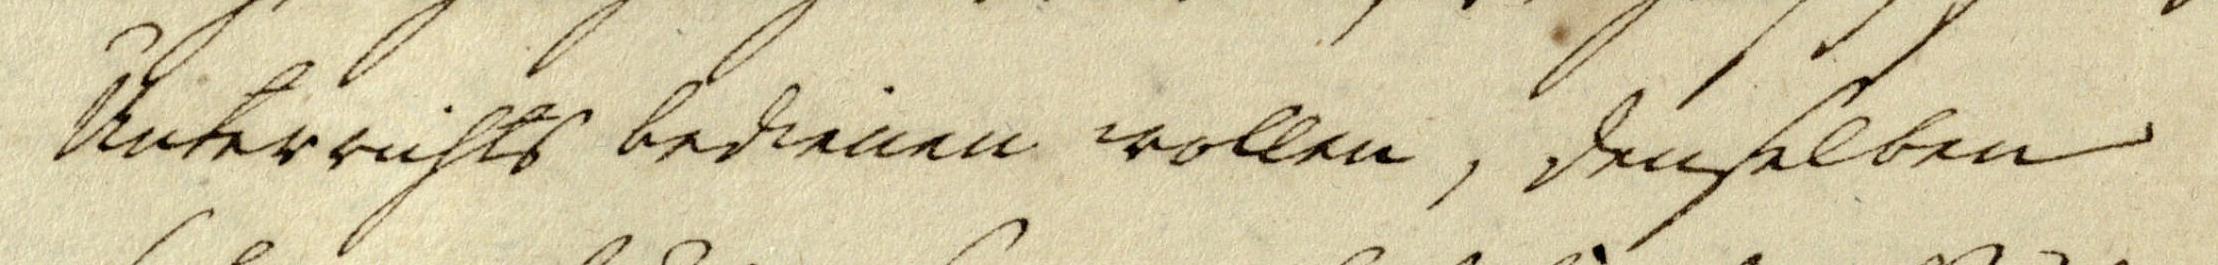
Unterrichts bedienen wollen, denselben
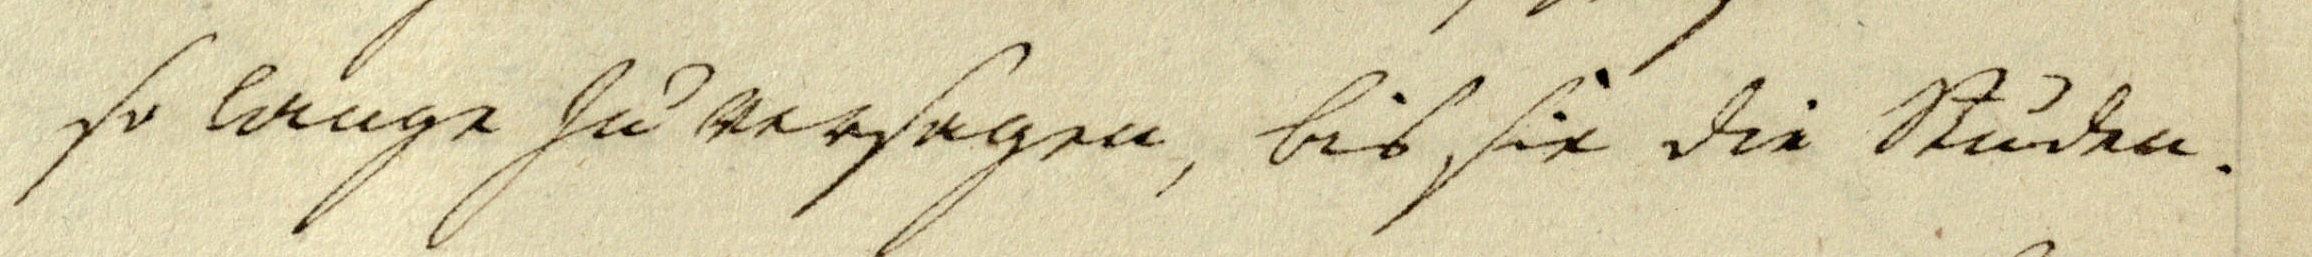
so lange zu versagen, bis sie die Studen¬
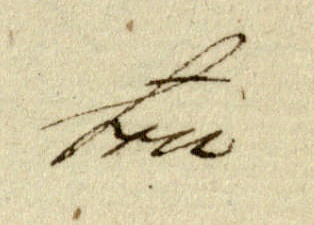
ten
